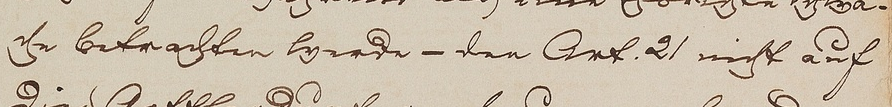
che betrachten werde – den Art. 21 nicht auf
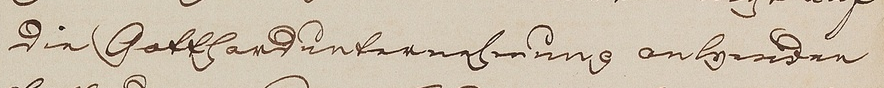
die Gotthardunternehmung anwenden
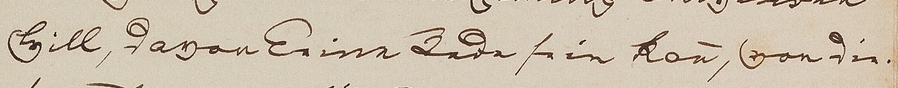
will, davon keine Rede sein kann, von die-
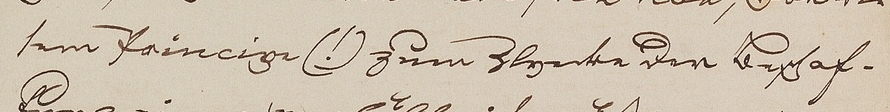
sem Principe (!) zum Zwecke der Beschaf-
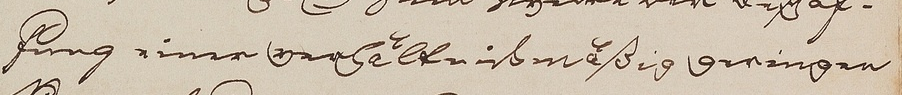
fung einer verhältnißmäßig geringen
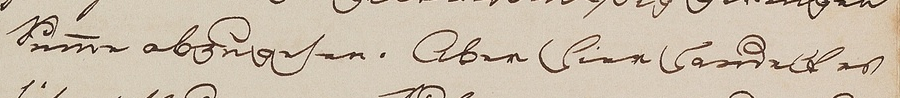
Summe abzugehen. Aber hier handelt es
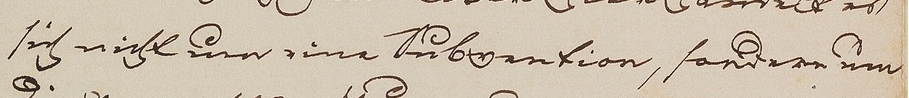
sich nicht um eine Subvention, sondern um
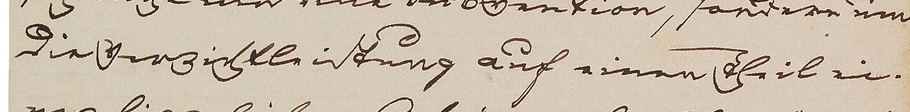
die Verzichtleistung auf einen Theil ei-
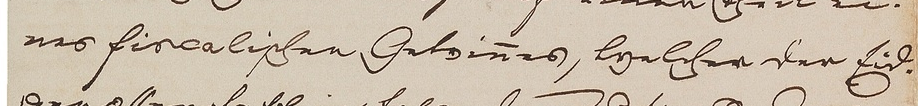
nes fiscalischen Gewinnes, welcher der Eid-
